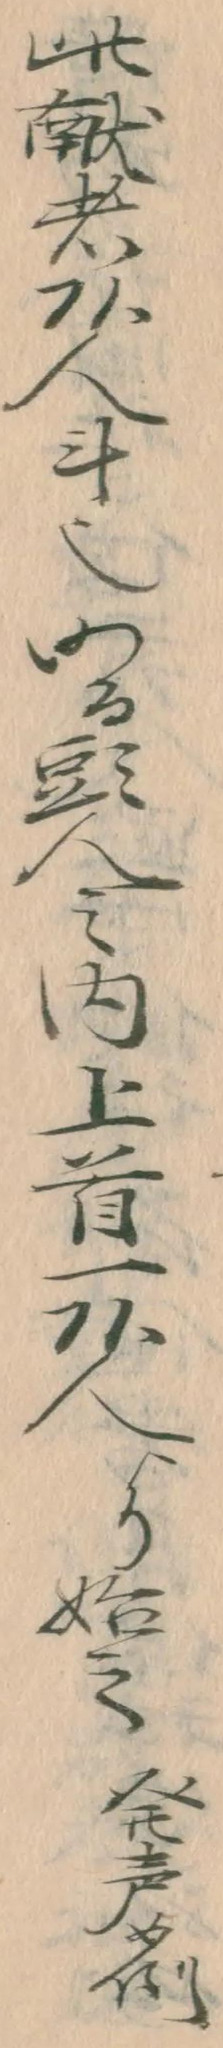此戦者頭人斗也仍而頭人之内上首一頭人より始之発声如例
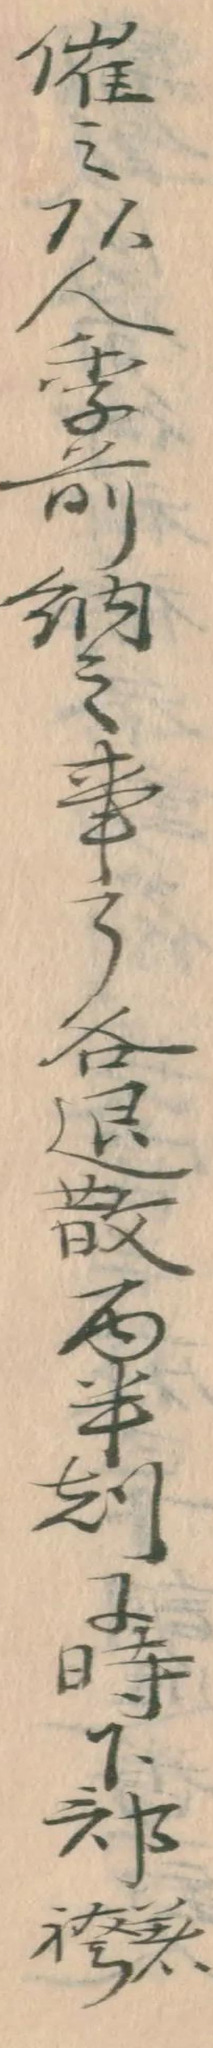催之頭人季前納之事了各退散酉半刻于時下部着袴
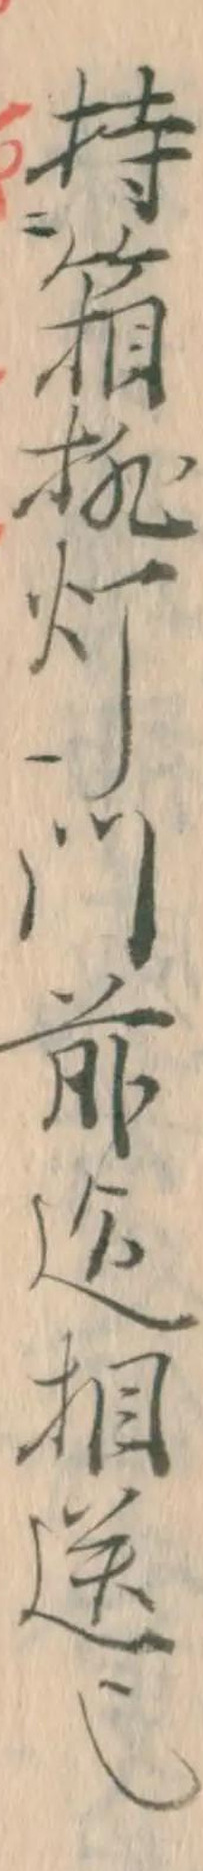持箱挑灯門前迄相送也
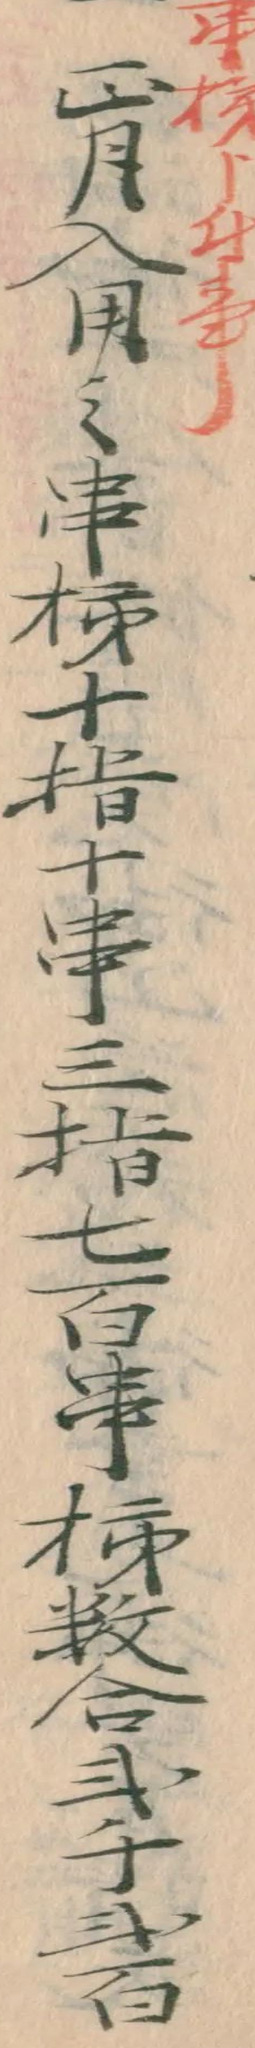一正月入用之串柿十指十串三指七百串柿数合弐千弐百
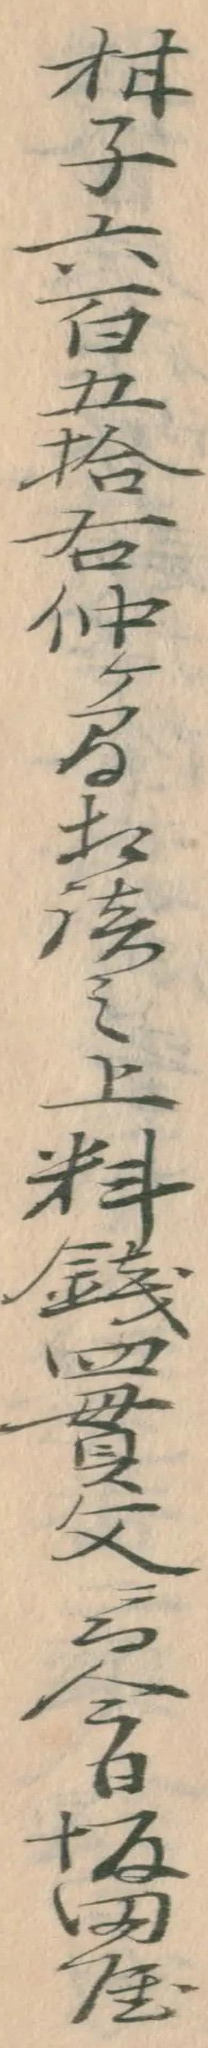柑子六百五拾右仲ヶ間相談之上料銭四貫文ニ而今日坂田屋

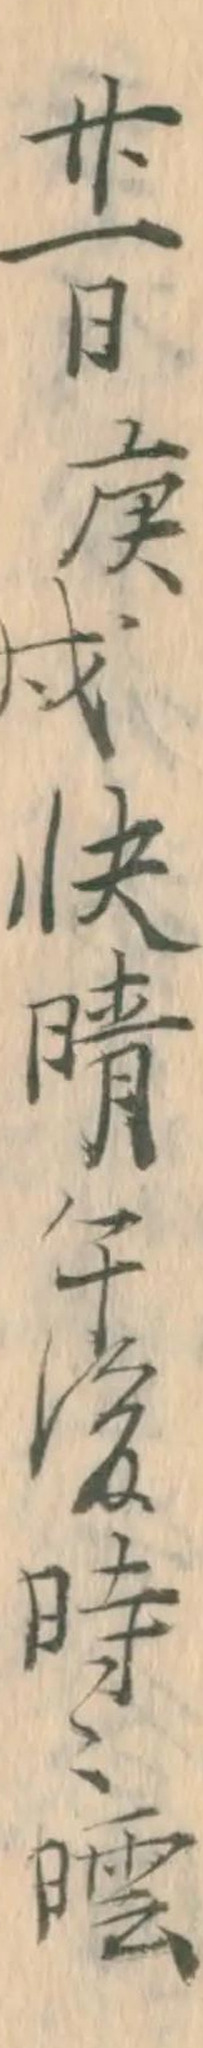廿一日庚戌快晴午後時々曇
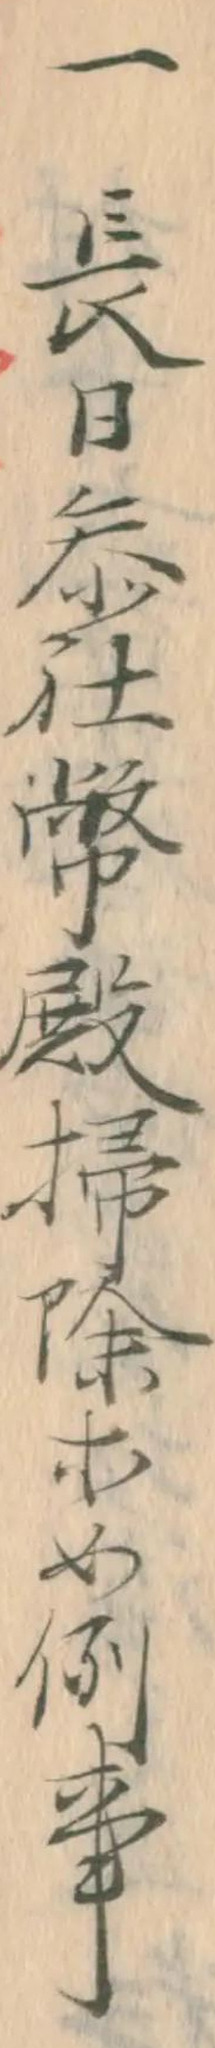一長日参社幣殿掃除等如例事
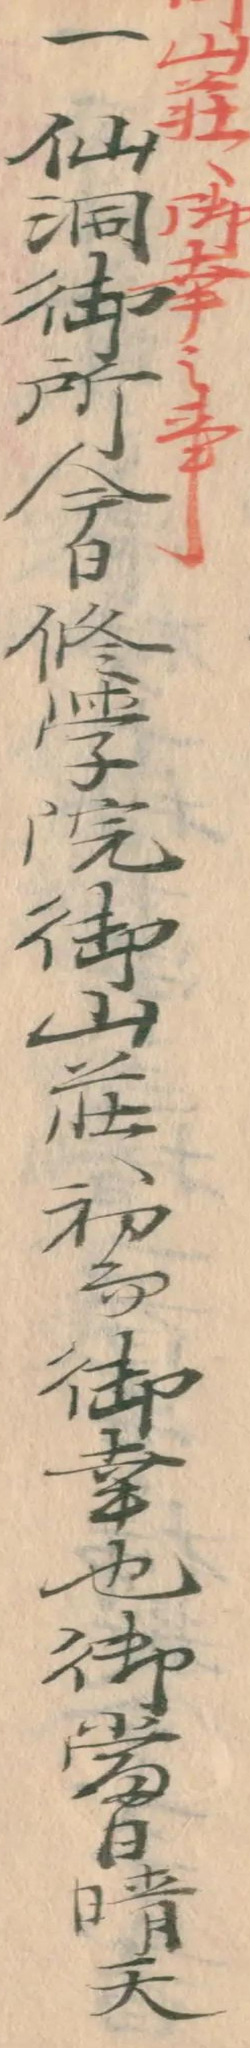一仙洞御所今日修學院御山荘へ初而御幸也御當日晴天
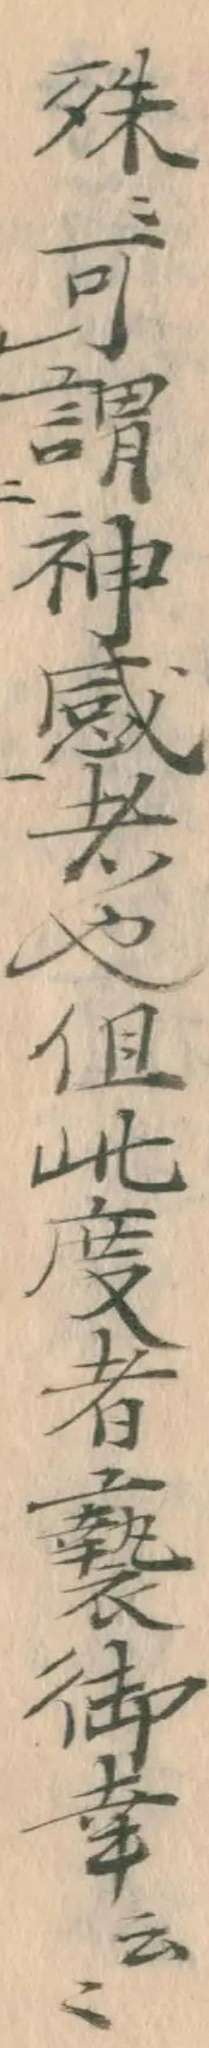殊ニ可謂神感者也但此度者藝御幸云々
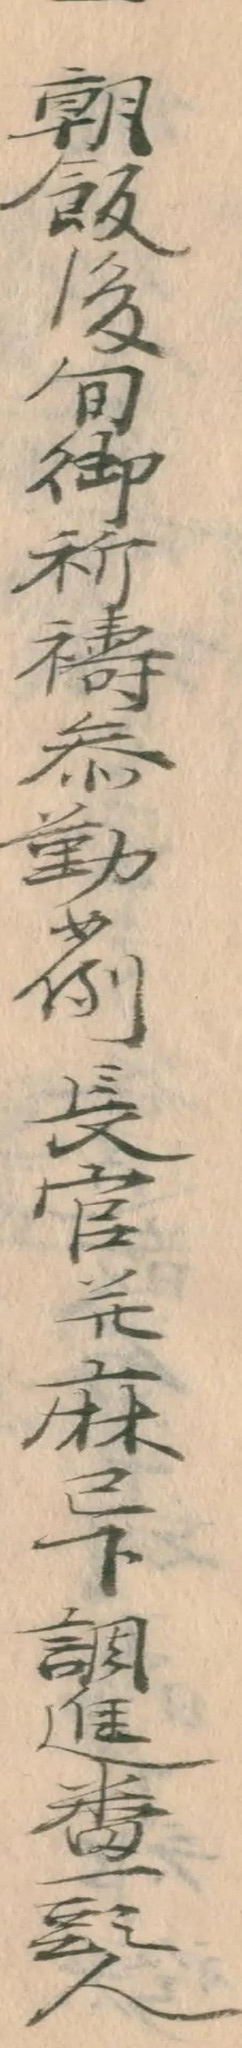一朝飯後旬御祈祷参勤如例長官并麻已下調進番一頭人
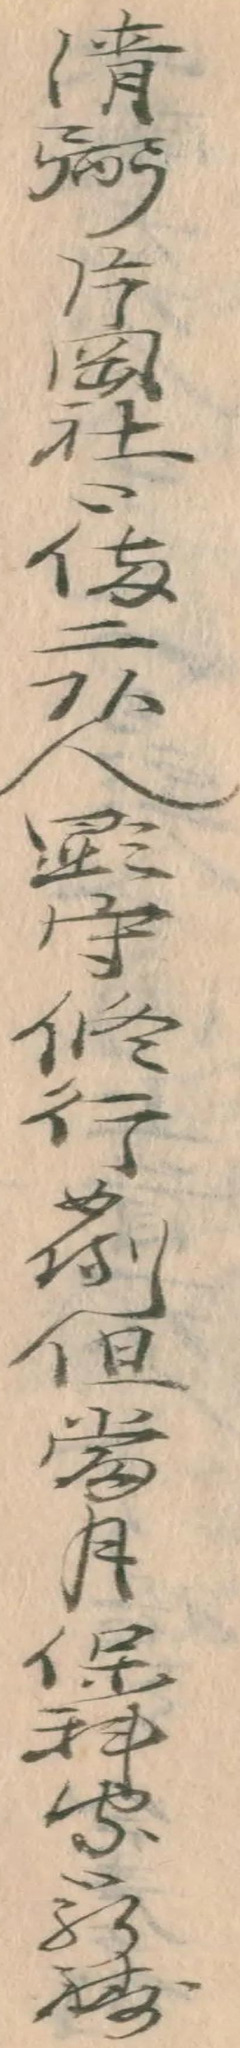清弼片岡社御備二頭人顕守修行如例但當月保科家御祈祷
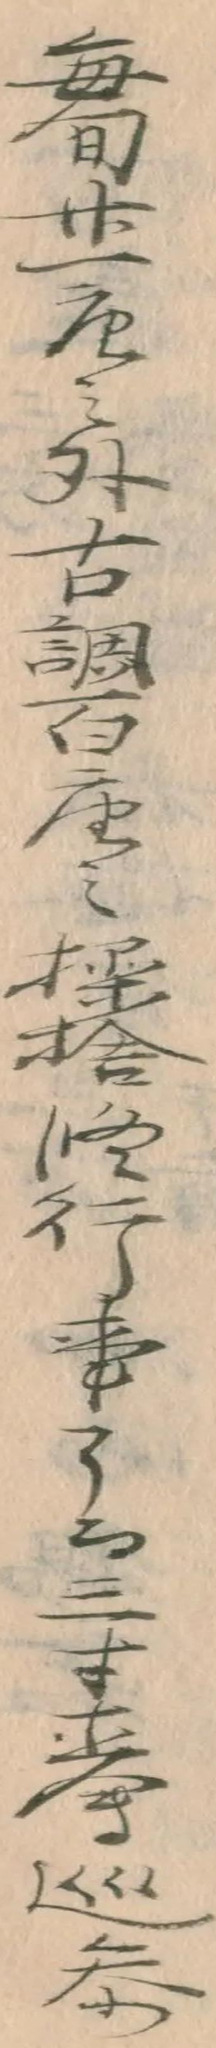毎旬廿一座之外古調百座之操捨修行事了而三寸直會巡参
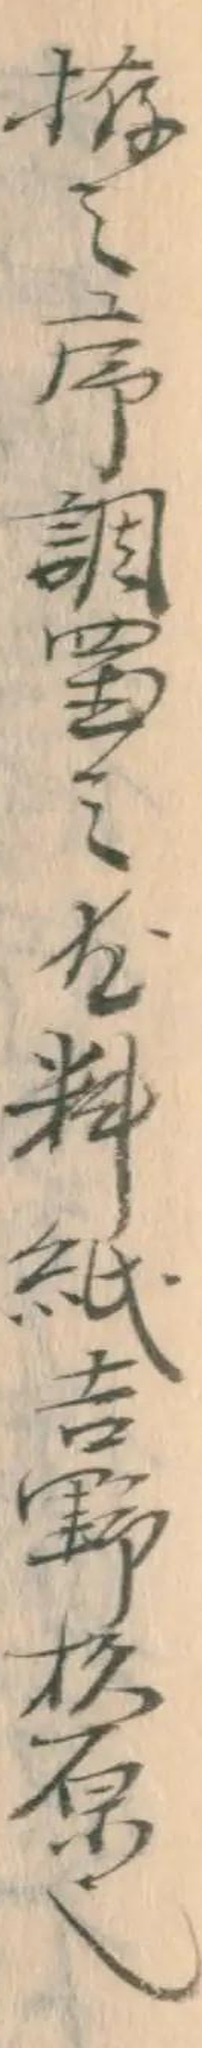拵之序調置之尤料紙吉野杦原也
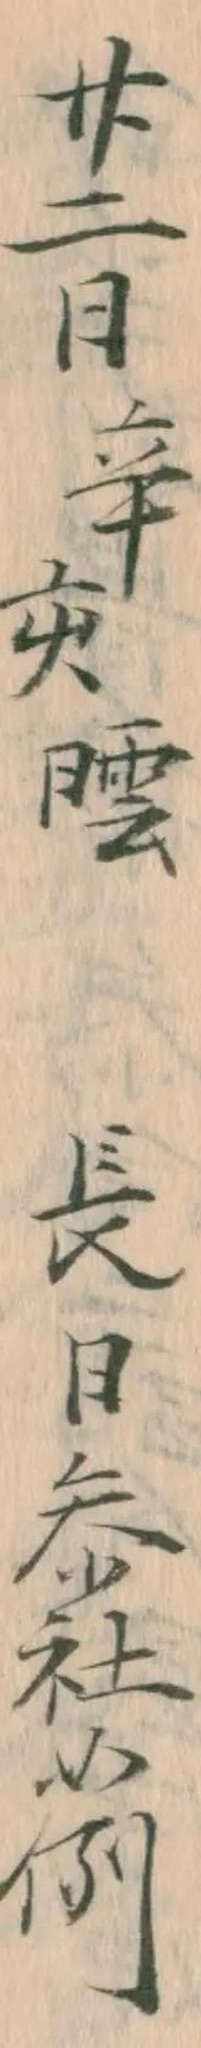廿二日辛亥曇長日参社如例
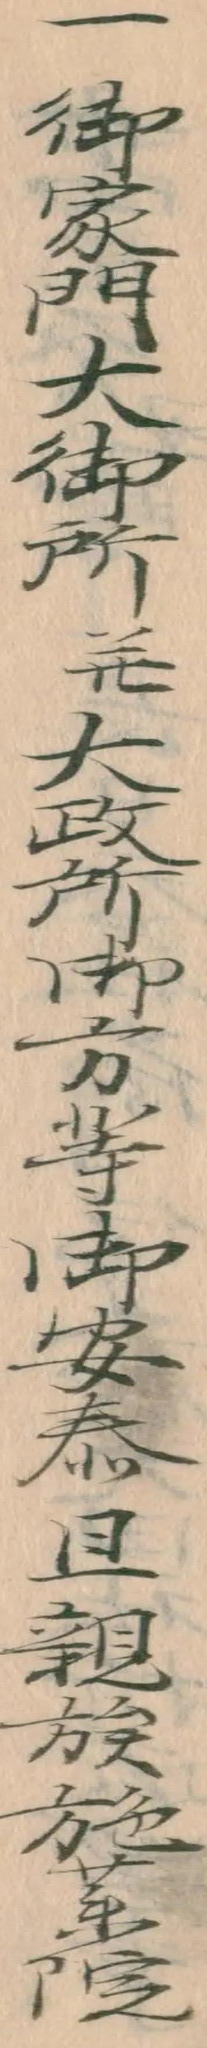一御家門大御所并大政所御方等御安泰且親族施薬院
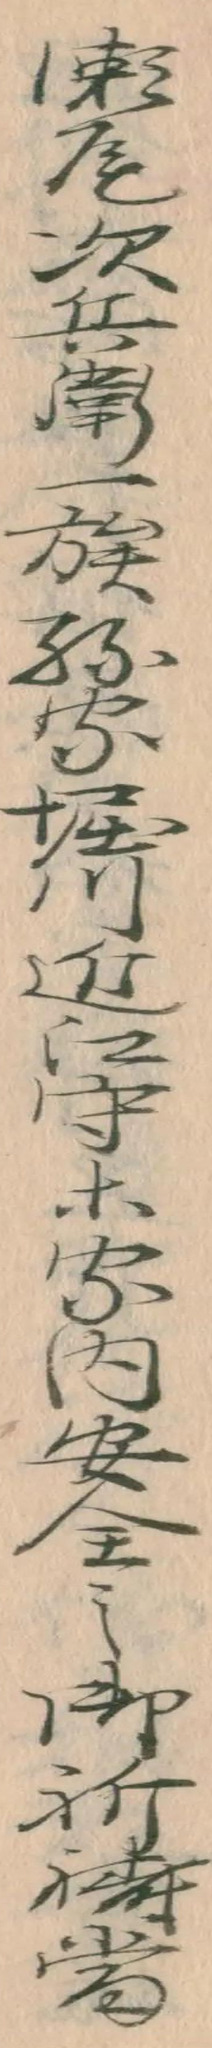瀬尾次兵衛一族孫家堀川近江守等家内安全之御祈祷當
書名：賀茂社記録. 第74冊
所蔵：国立国会図書館 National Diet Library, JAPAN
